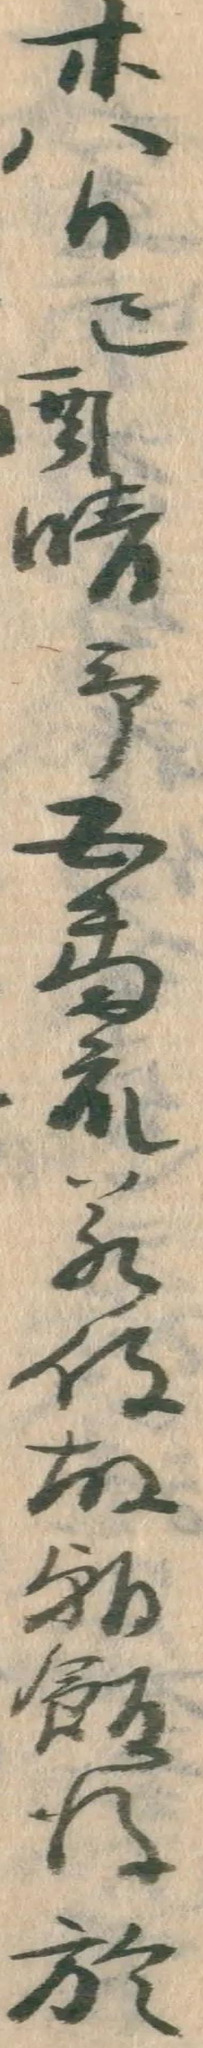廿八日己亥晴、予五番衆若役故、朝飯後、於
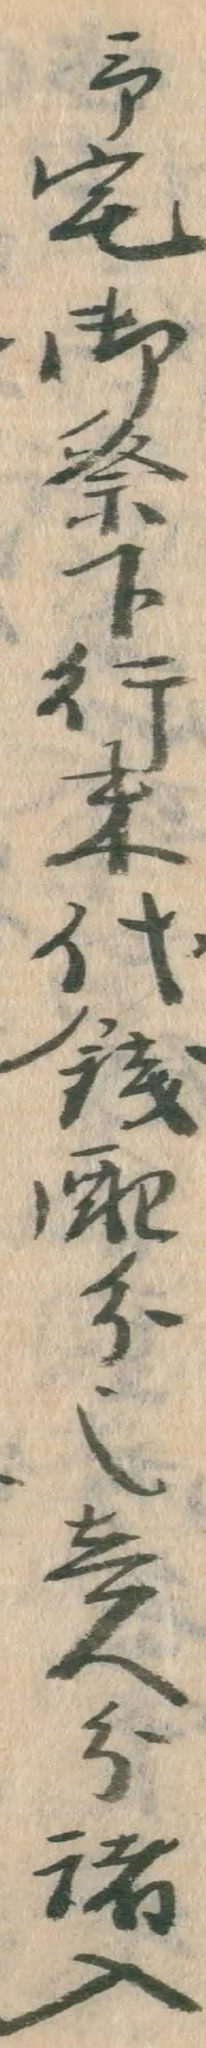予宅御祭下行米代銭配分也、壱人分諸入
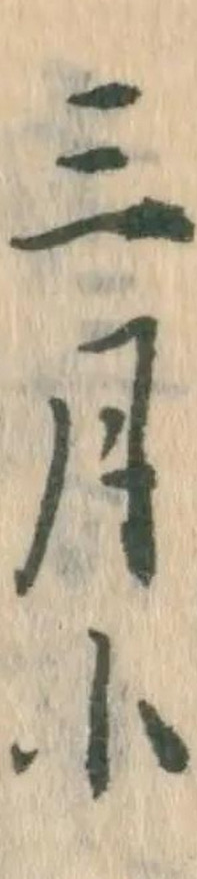三月小
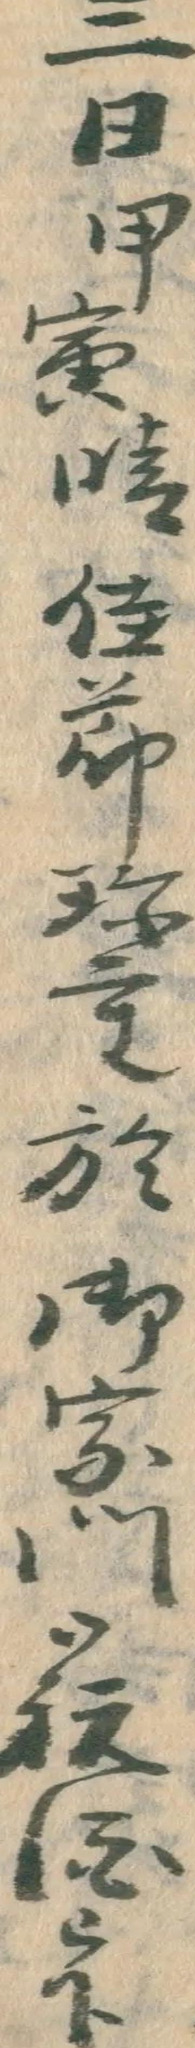三日甲寅晴、佳節珍重、於御家門御祝儀被下
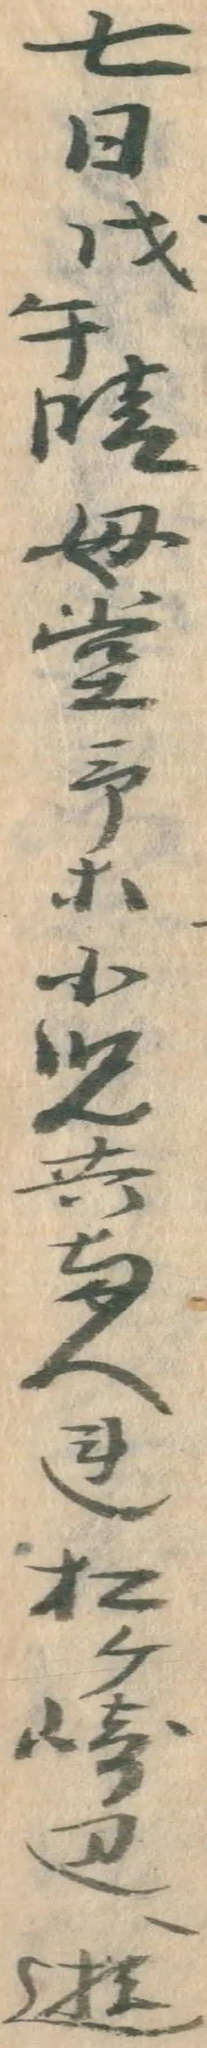七日戊午晴、母堂・予等、小児共両人連松ヶ崎辺へ遊

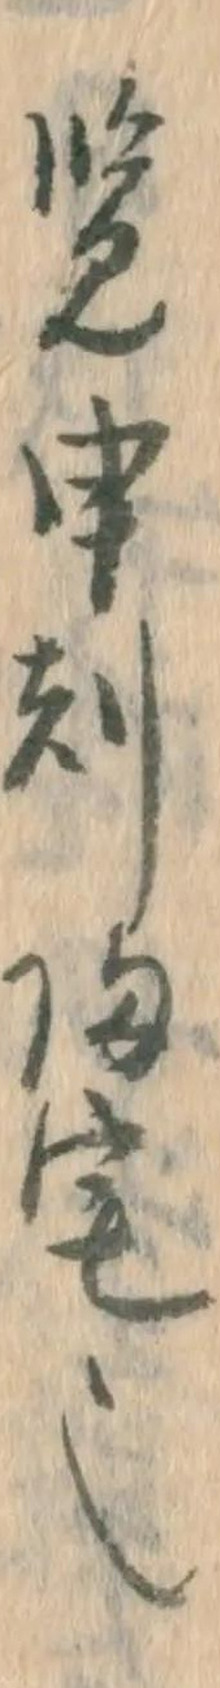晩申刻帰宅也、
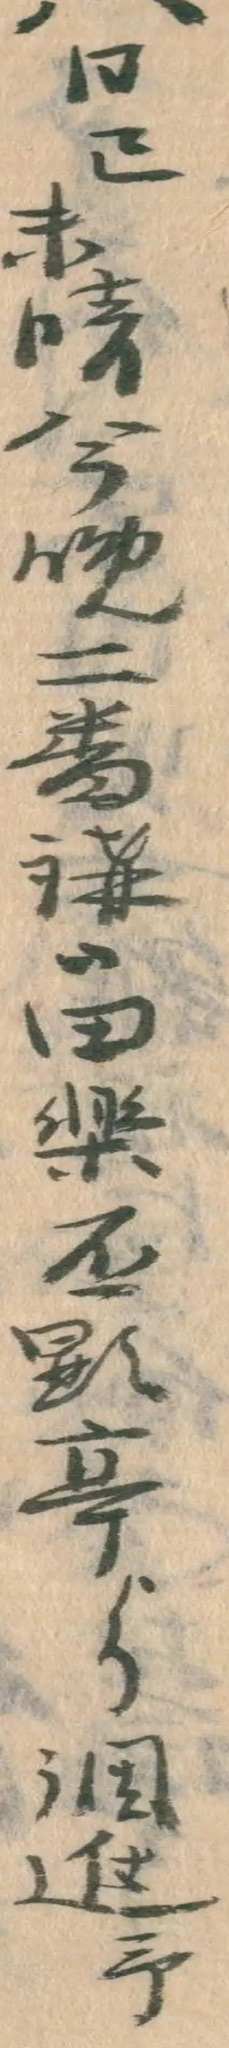八日己未晴、今晩二番講御田楽丕顕亭より調進、予
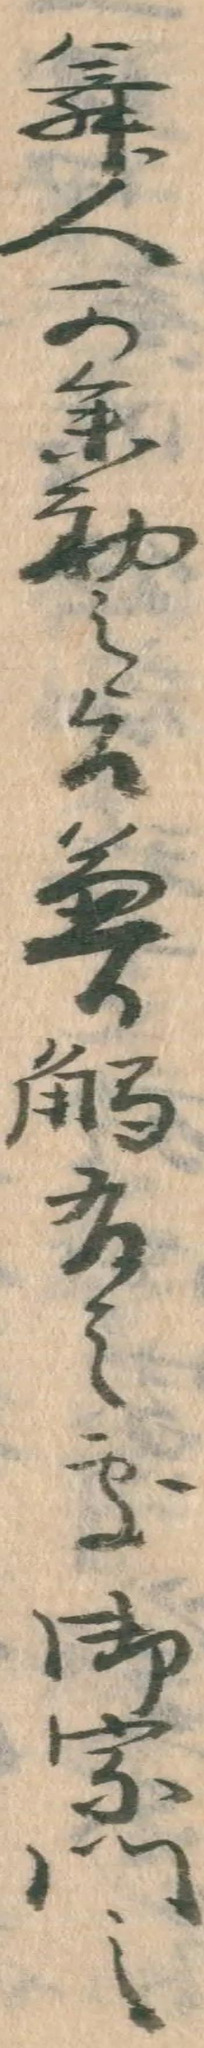舞人可参勤之旨、兼日触有之處、御家門之
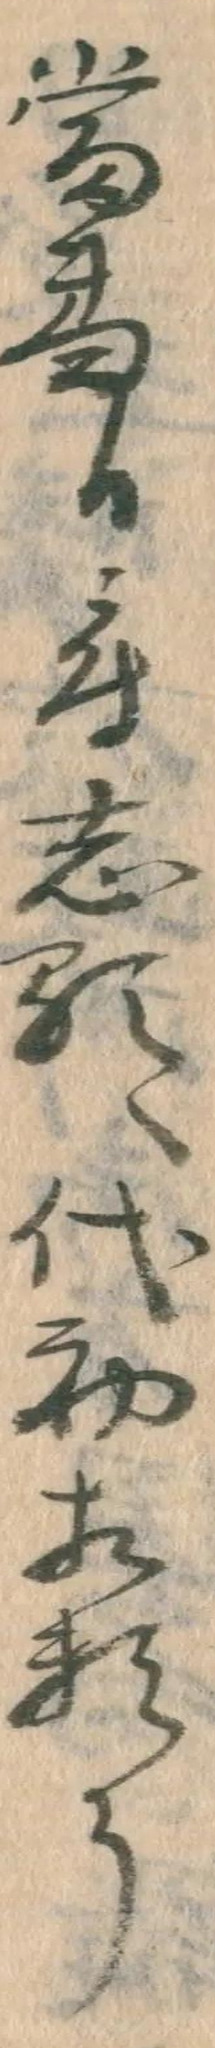當番日ニ付、志顕へ代勤相頼了、
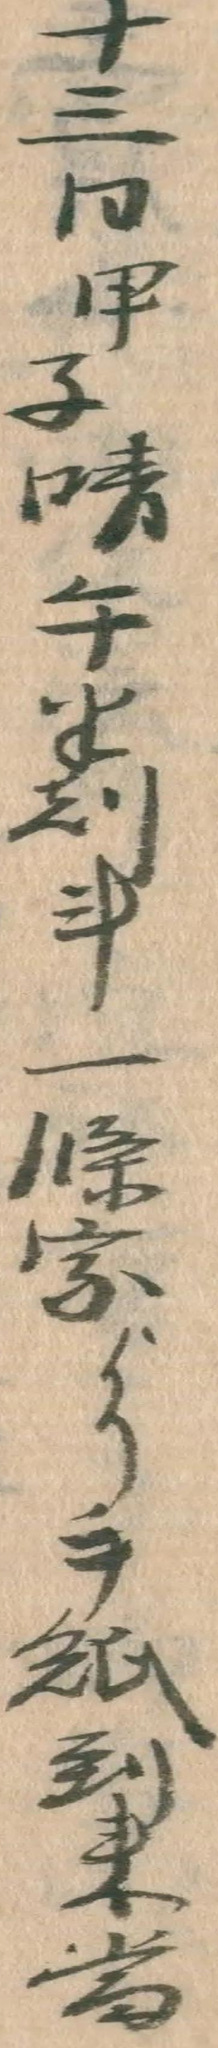十三日甲子晴、午半刻斗、一條家より手紙到来、當
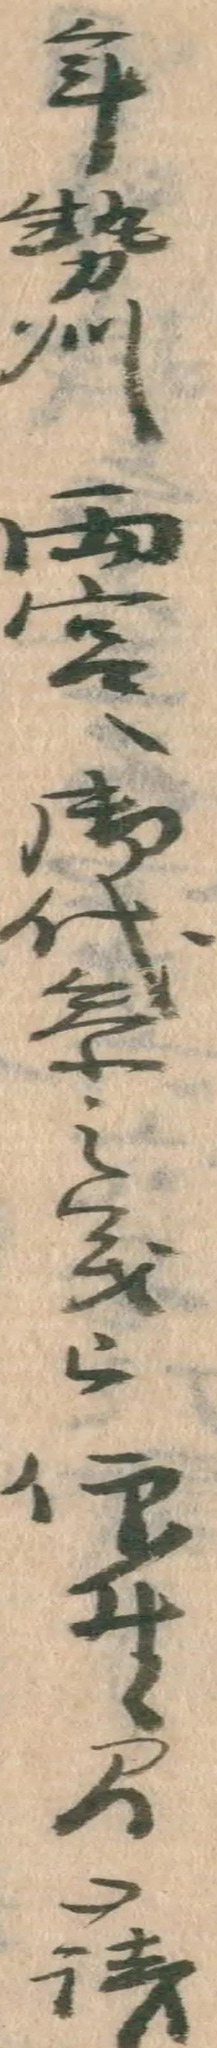年勢州両宮へ御代参之義被仰付候間、御請
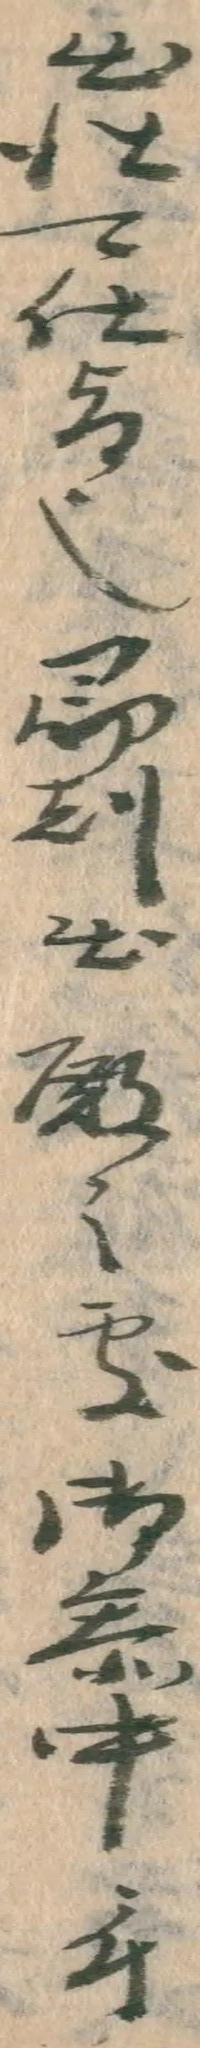出仕可仕旨也、即刻出殿之處、御参中ニ付
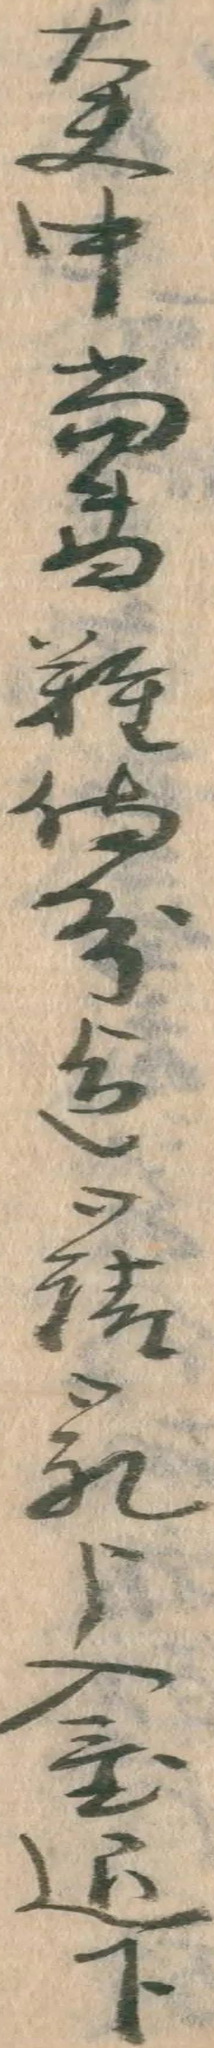大夫中當番難、侍分迄御請御礼申入置退下、
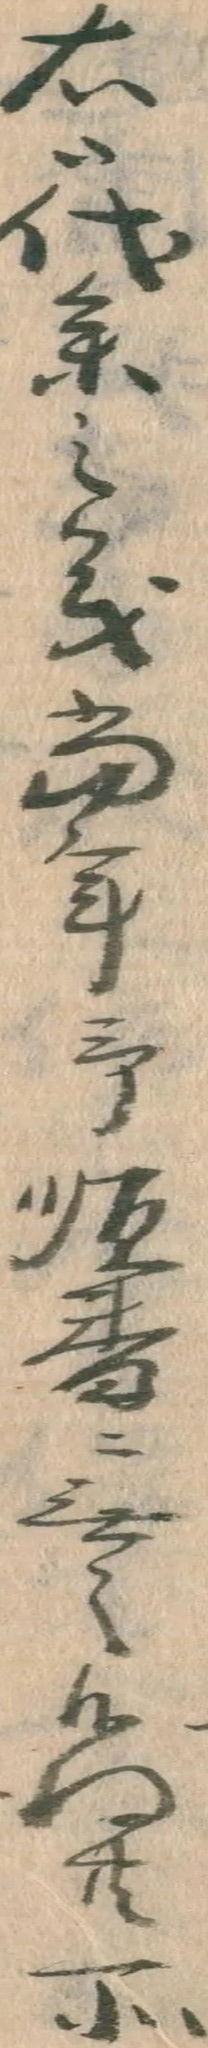右御代参之義、當年予順番に無之候得共、所
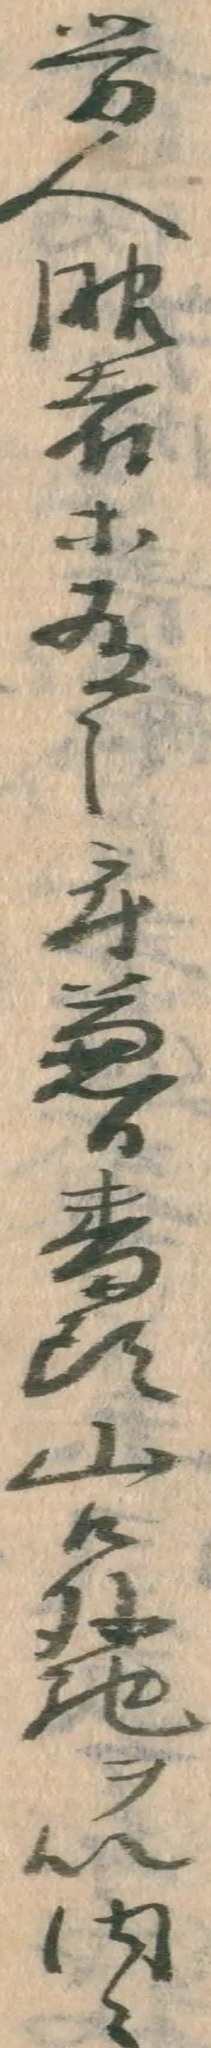労人服者等有之ニ付、兼而番頭山口外記ヲ以、内々
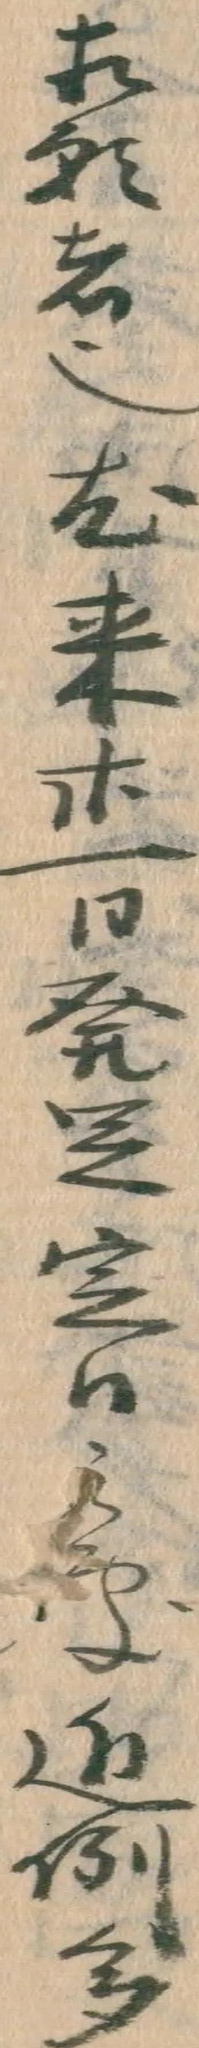相願者也、尤来廿一日発足定日之處、近例多
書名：賀茂社記録. 第63冊
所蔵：国立国会図書館 National Diet Library, JAPAN
